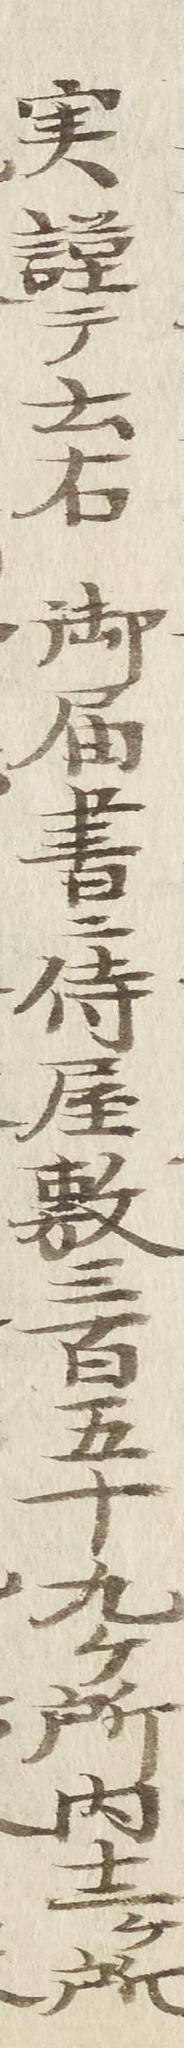実謹テ云右御届書ニ侍屋敷三百五十九ヶ所内十二ヶ所
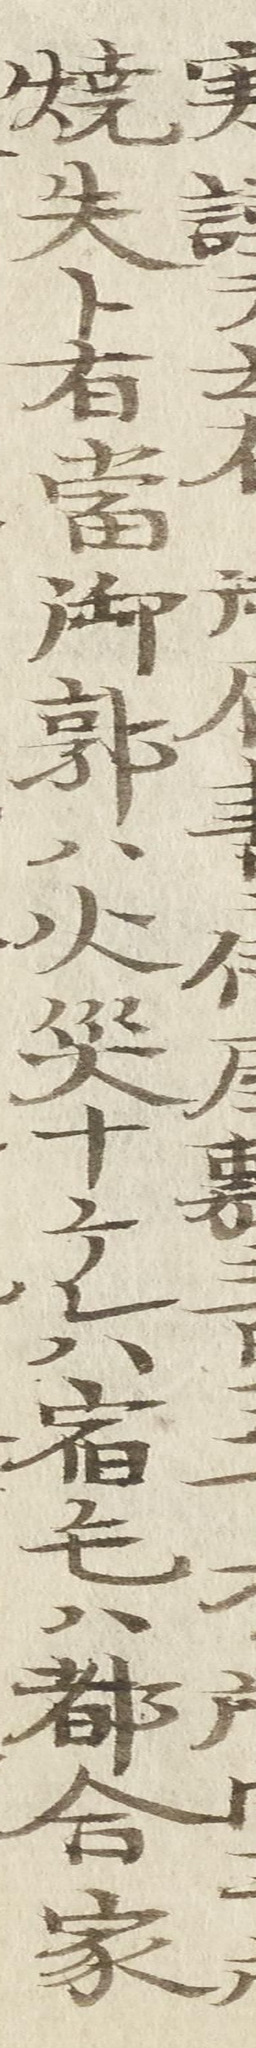焼失ト有当御郭ハ火災ナケレハ宿毛ハ都合家
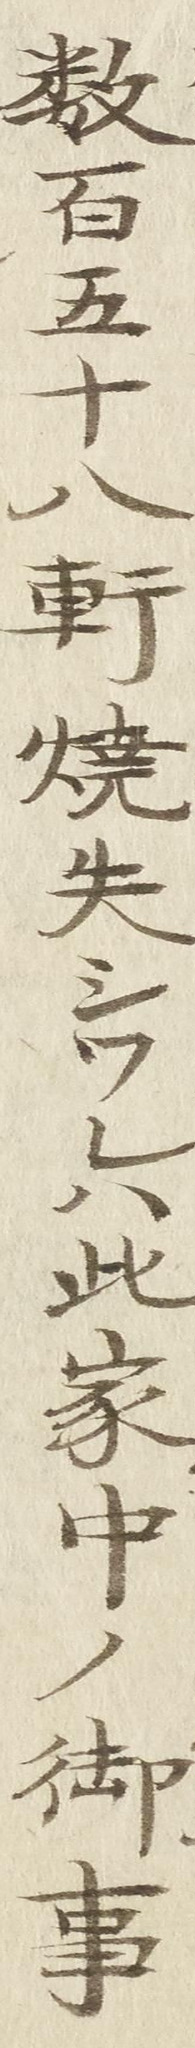数百五十八軒焼失シツレハ此家中ノ御事
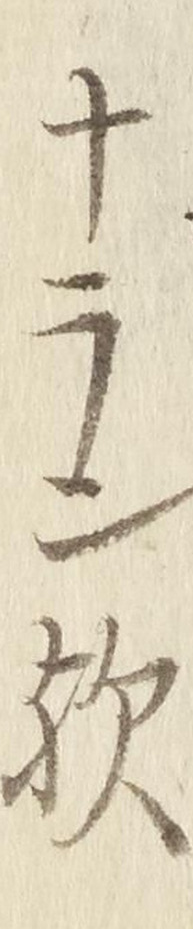ナラン歟
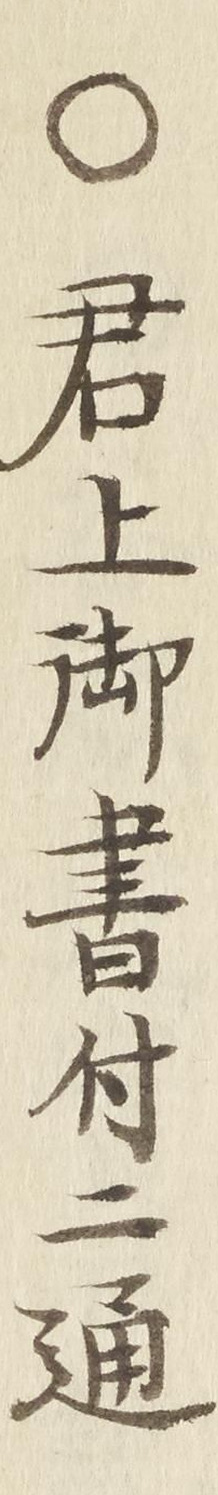〇君上御書付二通
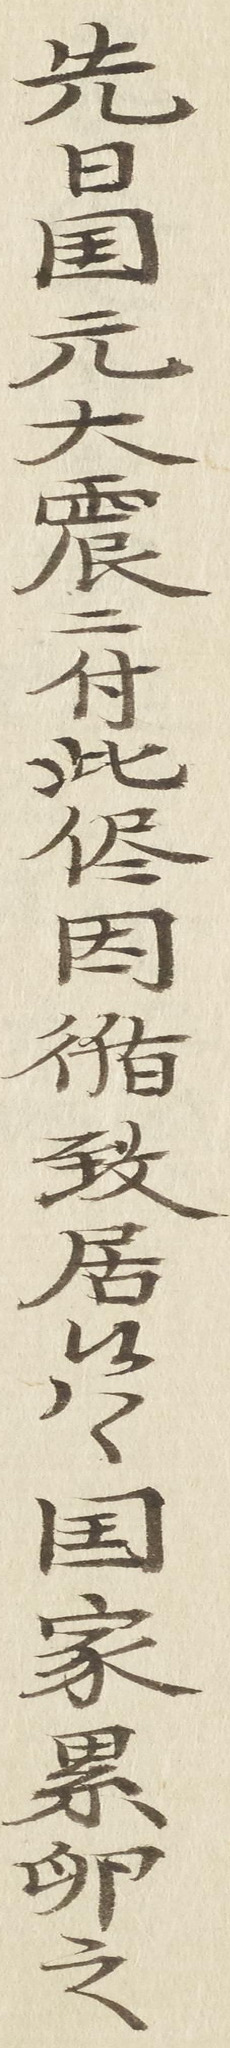先日国元大震ニ付此侭因循致居候ハゝ国家累卵之
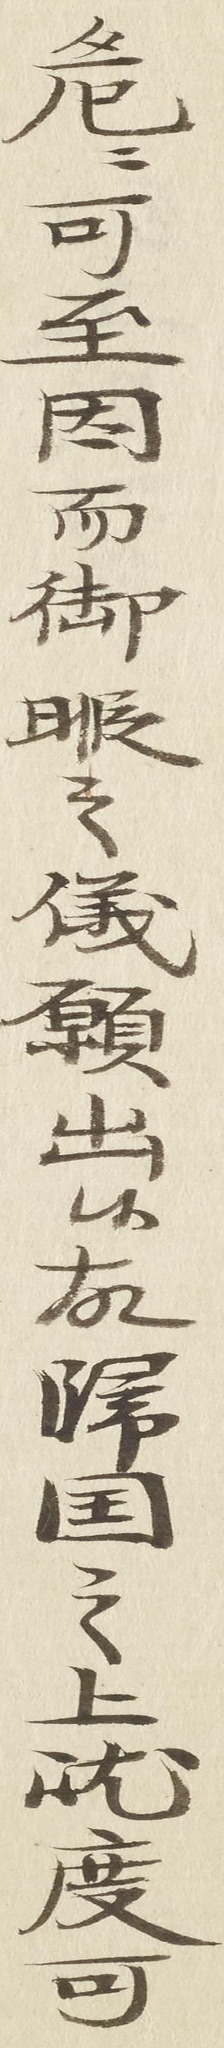危ニ可至因而御暇之儀願出候故帰国之上屹度可
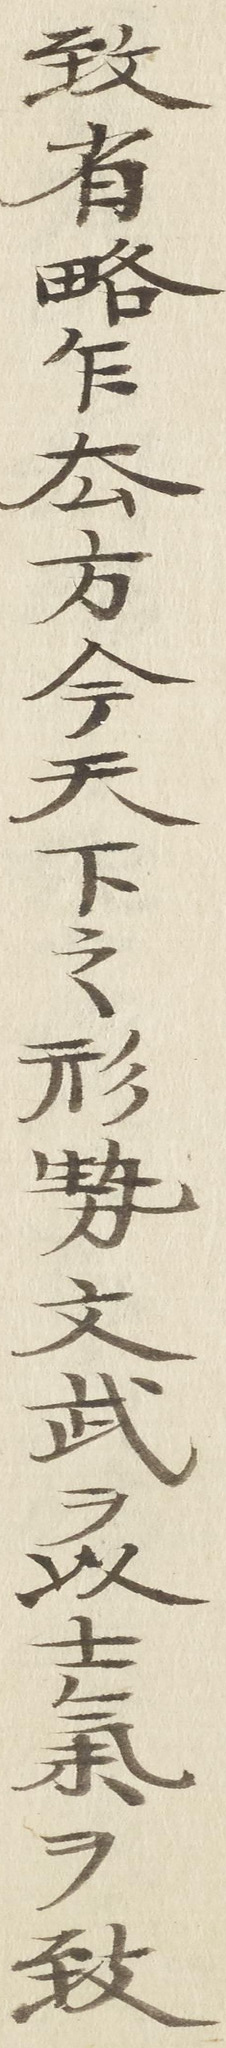致省略乍去方今天下之形勢文武ヲ以テ士気ヲ致
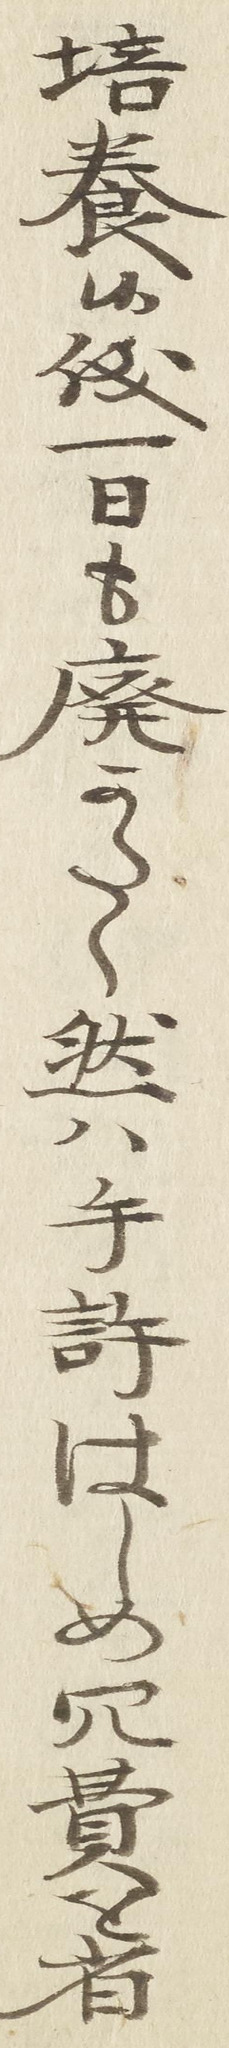培養候儀一日も廃かたし然ハ手許はしめ冗費を省
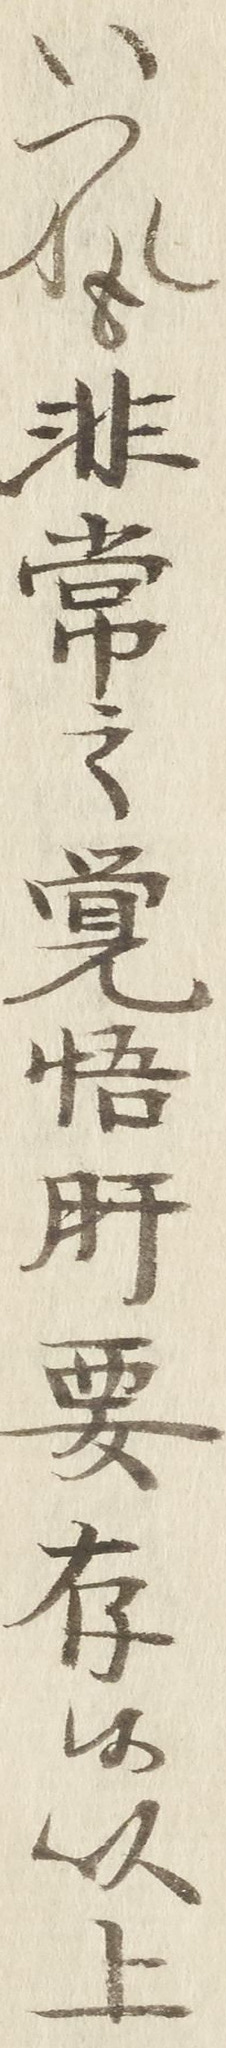いつれも非常之覚悟肝要存候以上
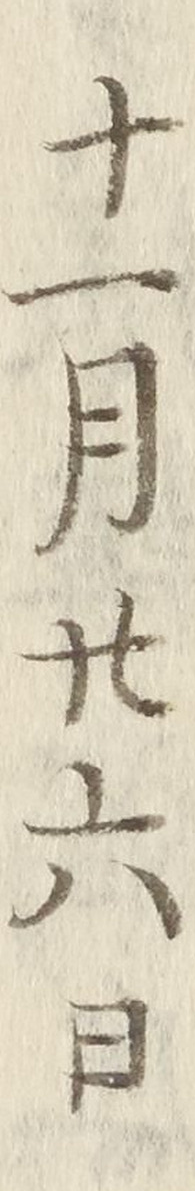十一月廿六日
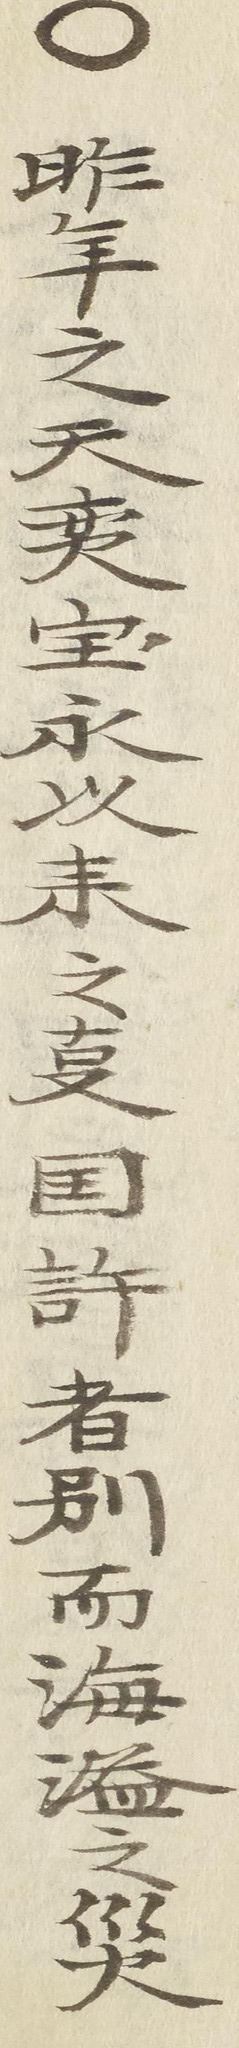〇昨年之天変宝永以来之事国許者別而海溢之災
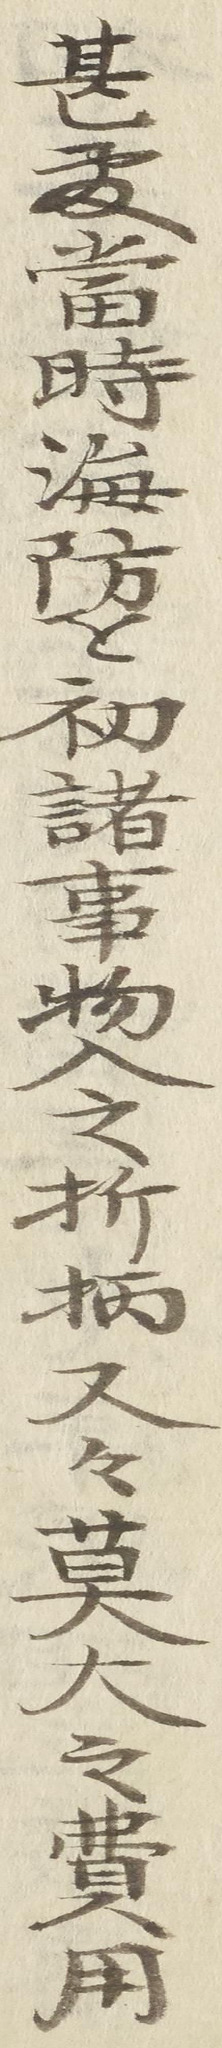甚敷当時海防を初諸事物入之折柄又々莫大之費用

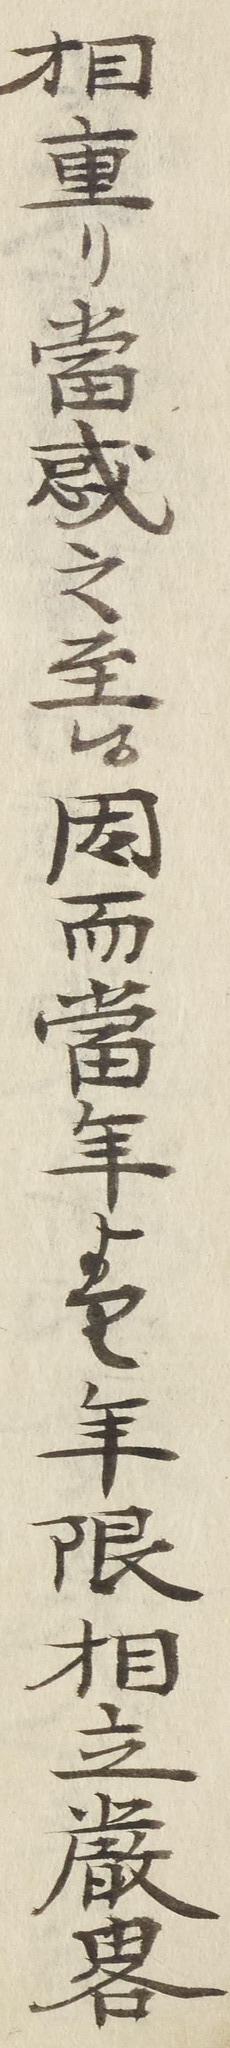相重り当惑之至候因而当年より年限相立厳略
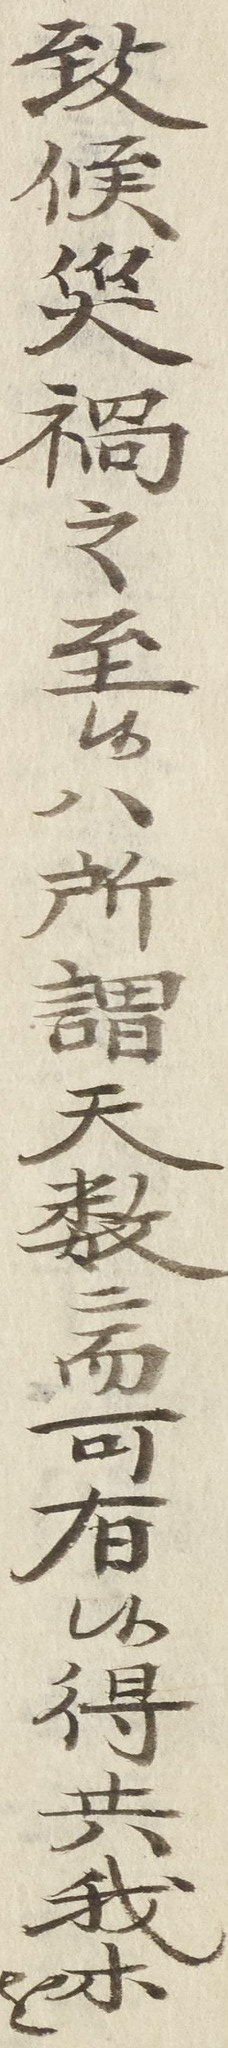致候災禍之至候ハ所謂天数ニ而可有候得共我等を
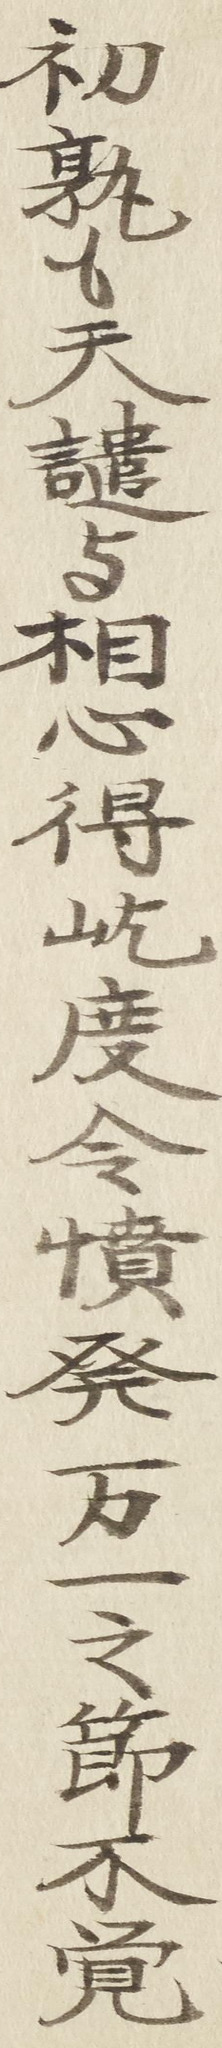初孰も天譴と相心得屹度令憤発万一之節不覚
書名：地震記　上
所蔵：東京大学地震研究所図書室 Earthquake Research Institute Library, The University of Tokyo, JAPAN
